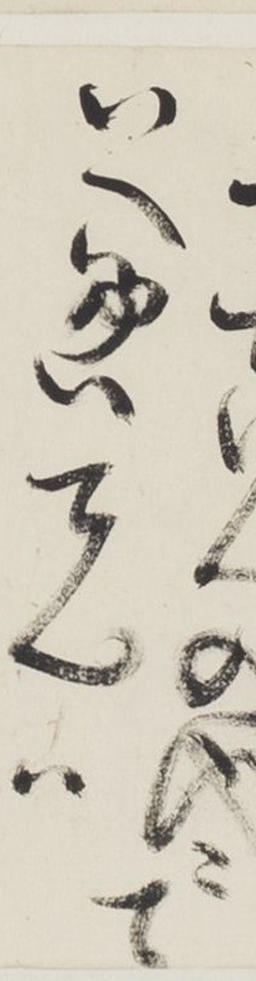いへたいてんは
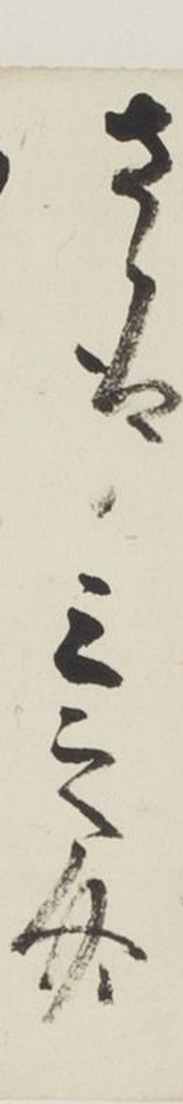さゝや三之介
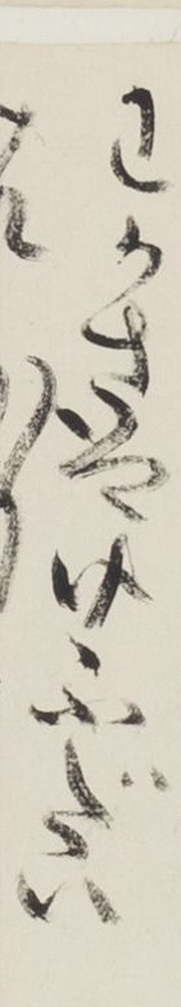わかさやけふだい
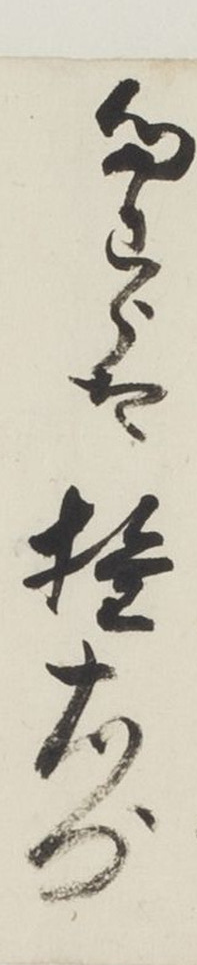たわらや権右衛門
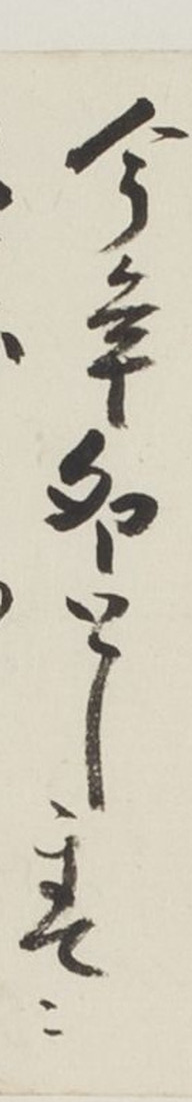今年卯としまてに
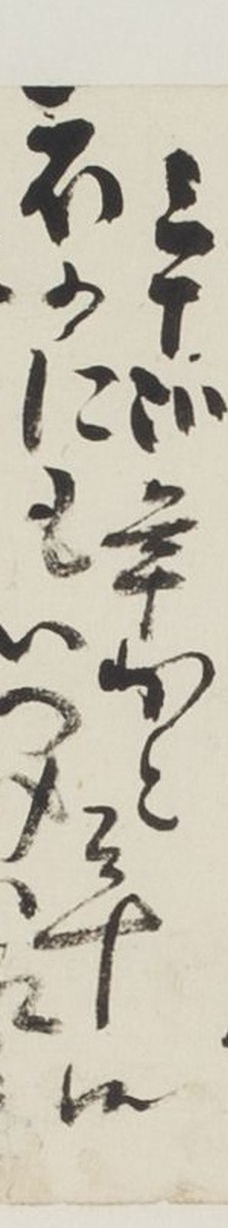ほかはあといつち申候
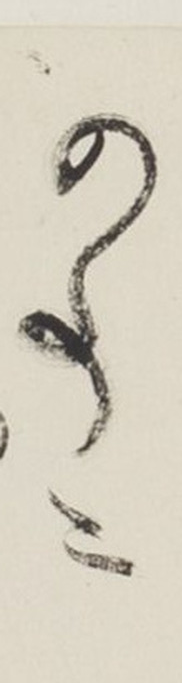の事に
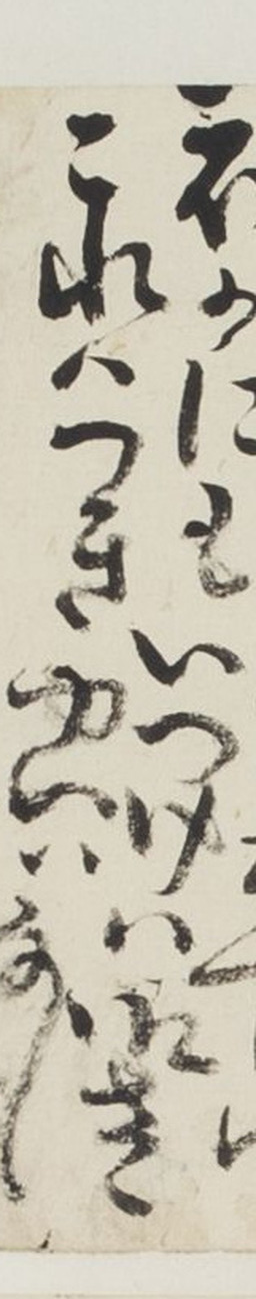これはつきやいはなし
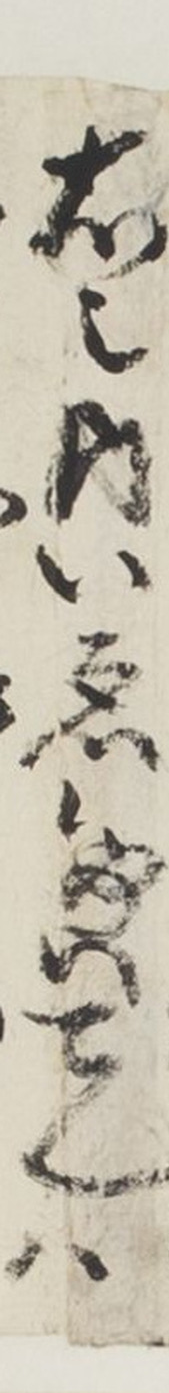右之内いゑたいてんは
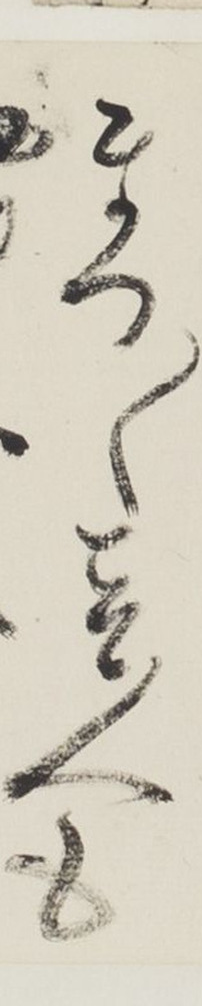まつ〳〵壱人も
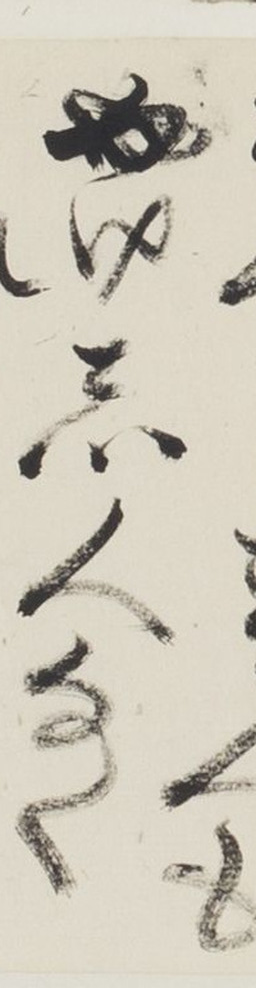やけし人なく
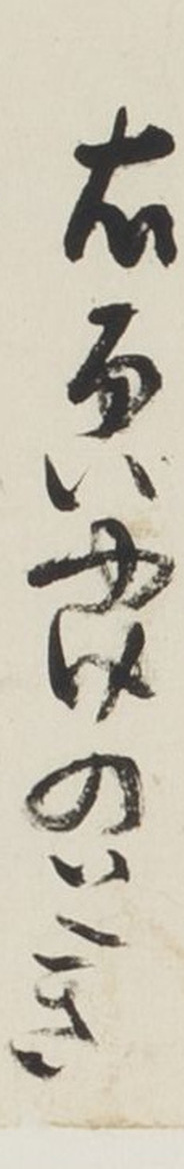右るいやけのとき
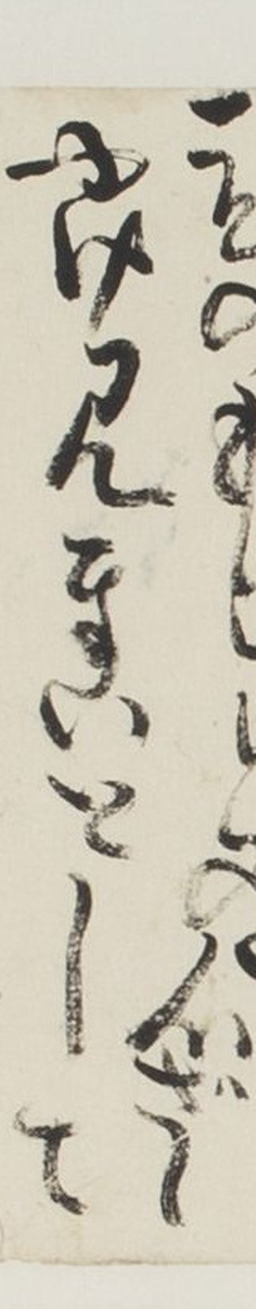やけ見まいとして
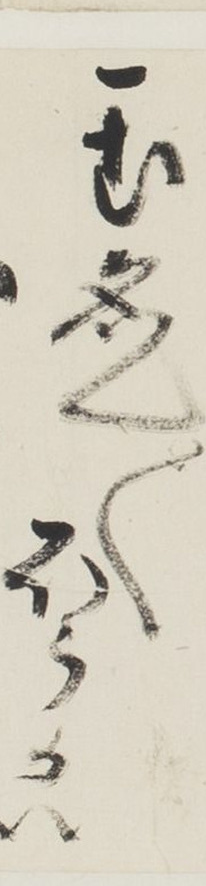一むゑん〳〵ほうかい
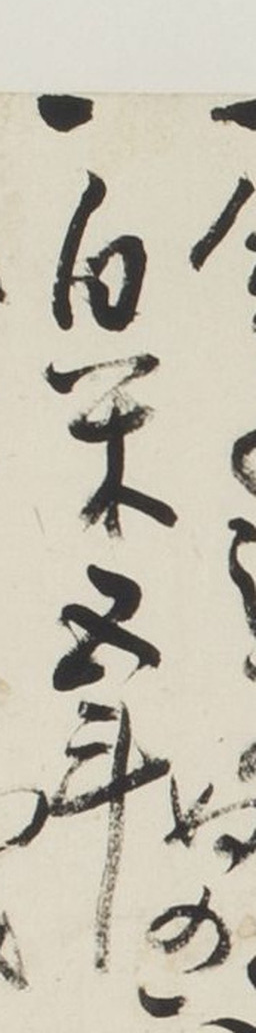一白米五斗
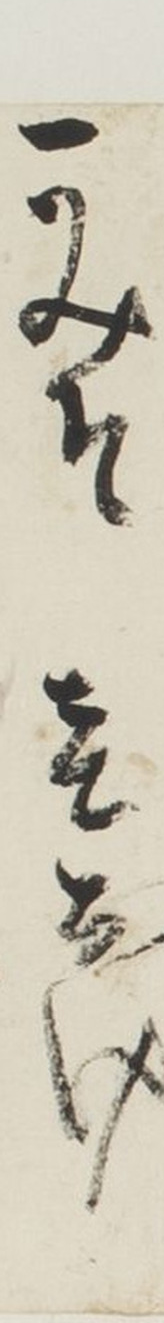一みそ壱おけ
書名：京洛中大焼節届の次第
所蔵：あいおいニッセイ同和損保株式会社
